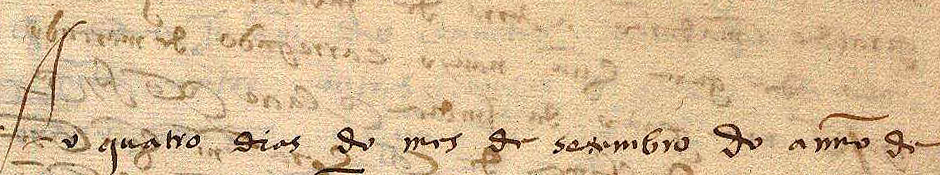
Aos quatro dias do mes de setembro do an̅no de
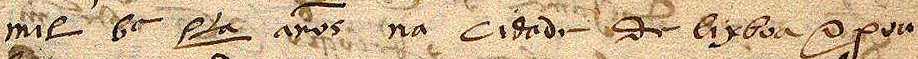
mil bc Lta an̄os na cidade de lixboa e pou
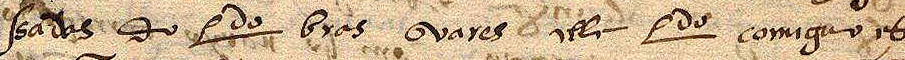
ssadas do Ldo bras soares elle Ldo comiguo es
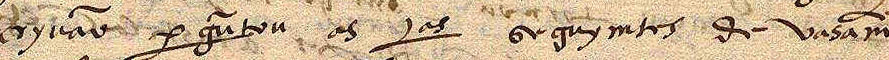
cryuão ꝑ gūtou as tas seguymtes devasamte
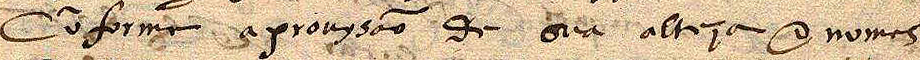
Co̅forme a prouysão de sua alteza e nomes
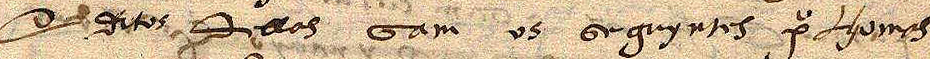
e ditos dellas sam os seguyntes po thomas
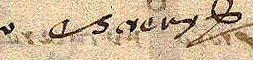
o escreuy
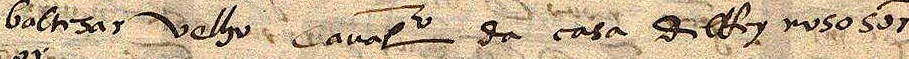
baltesar velho caualro da casa del Rey noso sōr
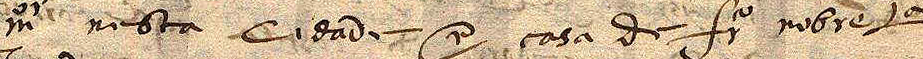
mor nesta cidade e̅ casa de frco nobre ta
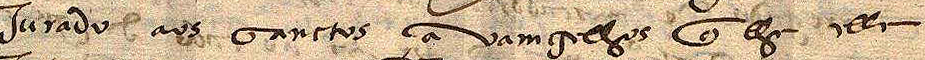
Jurado aos sanctos avamgelhos q̅ lhe elle
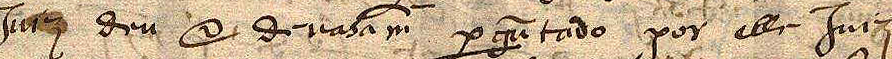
Juiz deu e deuasamte ꝑ g̅utado por elle Juiz
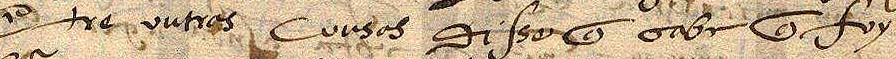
e̅tre outras cousas disse q̅ sabe q̅ foy
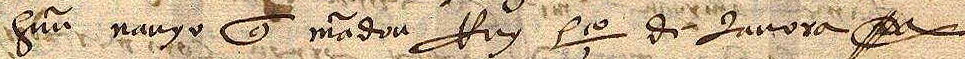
huu̅ nauyo q̅ mādou Ruy Lço de tauora _ da
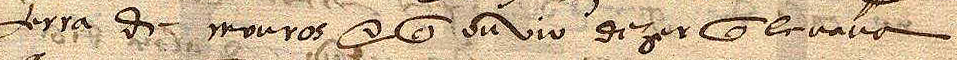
terra de mouros e q̅ ouvio dezer q̅ leuaua
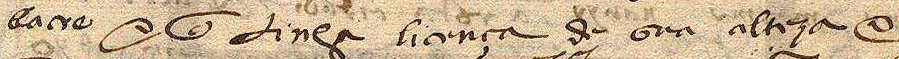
lacre e q̄ tinha licença de sua alteza e
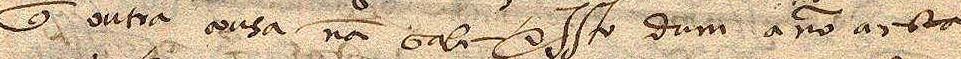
q̅ outra cousa n̅a sabe e Jsto dum an̅o a esta
